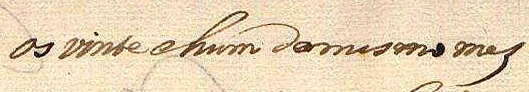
os vinte e hum do mesmo mez
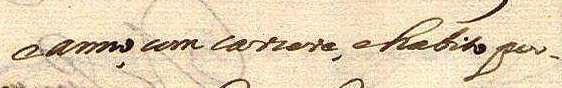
e anno, com carcere, e habito per
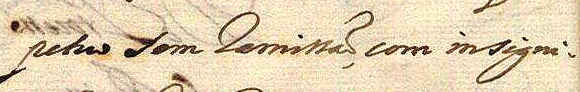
petuo sem Remissaõ, com insigni
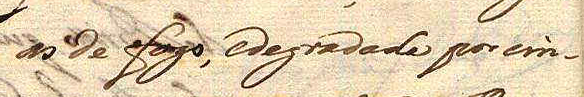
as de fogo, e degradada por cin
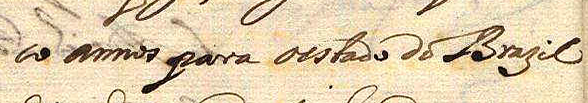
co annos para o estado do Brazil
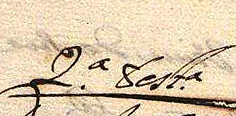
2.a test.a
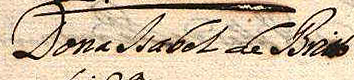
Dona Isabel de Britto
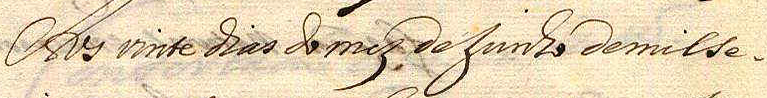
Aos vinte dias do mez de Junho de mil se
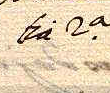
tia 2.a
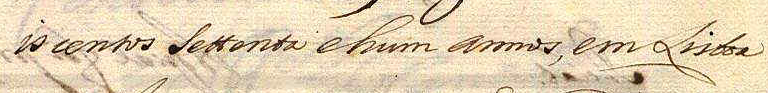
iscentos settenta e hum annos, em Lisboa
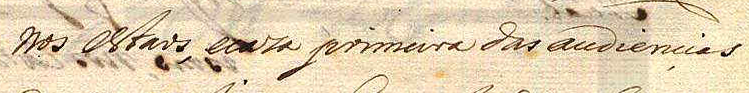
nos estaos, e caza primeira das audiencias
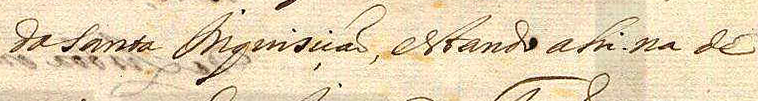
da santa Inquisiçaõ, estando ahi na de
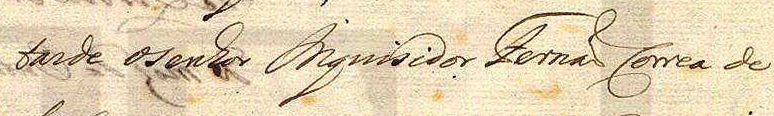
tarde o senhor Inquisidor Fernaõ Correa de
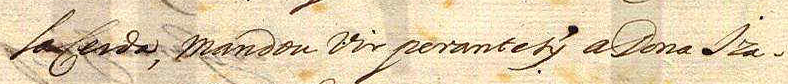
LaCerda, mandou vir perante sy a Dona Iza
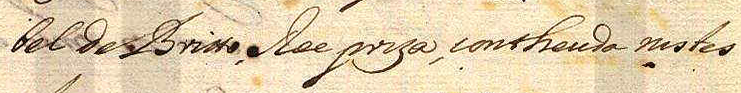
bel de Britto, Ree preza, contheuda nestes
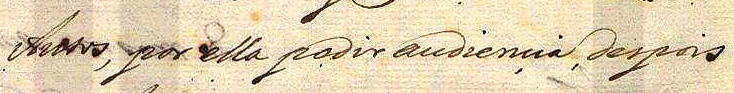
Autos, por ella pedir audiencia, despois
